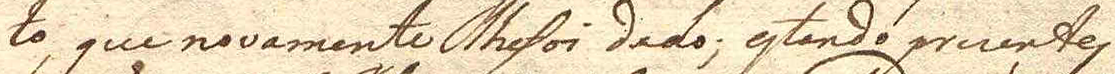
to, que novamente lhe foi dado; estando prezentes
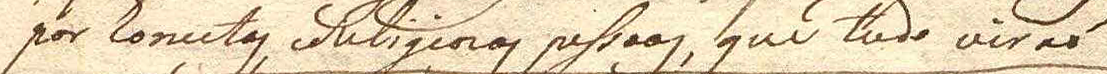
por honestas, e Religiozas pessoas, que tudo viraõ
